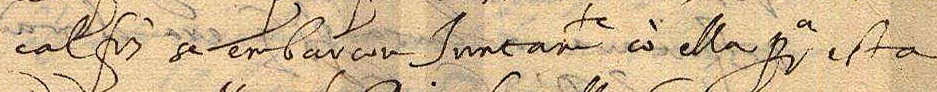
çal frz̄ se embarcou Iuntamte cō ella ꝑa esta
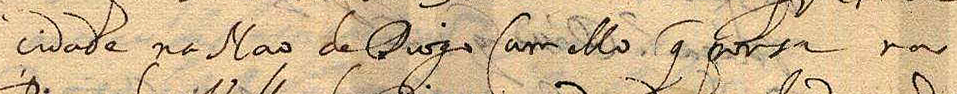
cidade na Nao de Diogo Camello q̄ pousa na
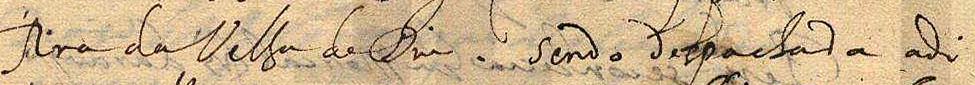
Rua da Velha de Diu. sendo despachada a di
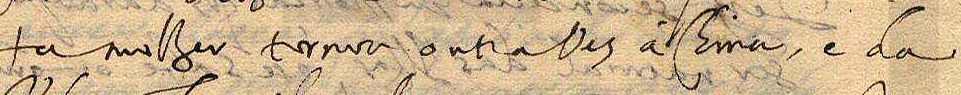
ta molher tornou outra Ves à China, e da
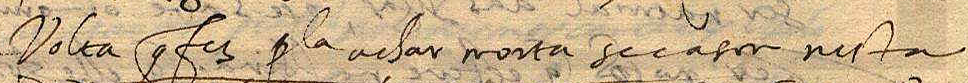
Volta q̄ fez pla achar morta se casou nesta
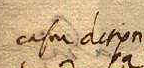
casou despois
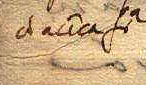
cō acēça fra
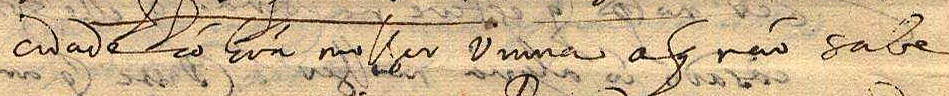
cidade cō huā molher viuua a q̄ naõ sabe
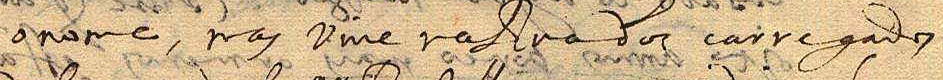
o nome, mas viue na Rua dos carregados
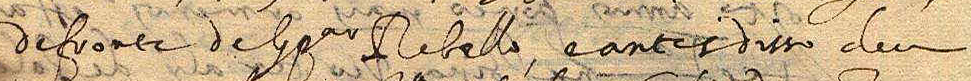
defronte de Gpar Rebello, e antes disso deu
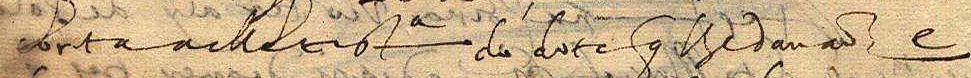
conta a elle testa do dote q̅ lhe dauaõ e
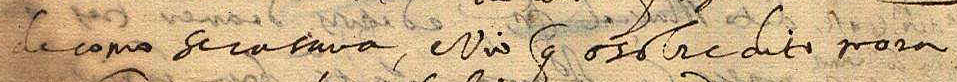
de como se casava, e vio q̄ o sobredito mora
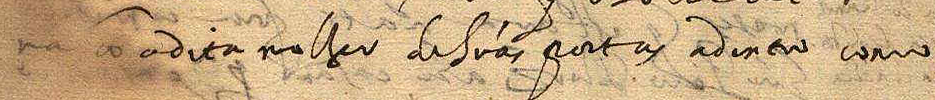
ua c̄o a dita molher de huās portas adentro como
